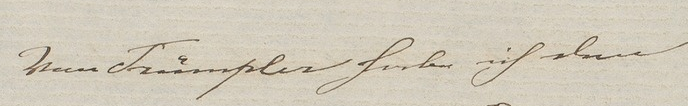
Von Trümpler habe ich den
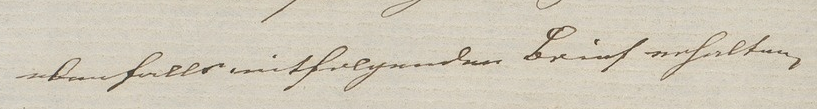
ebenfalls mitfolgenden Brief erhalten,
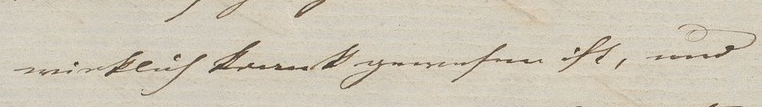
wirklich krank gewesen ist, und
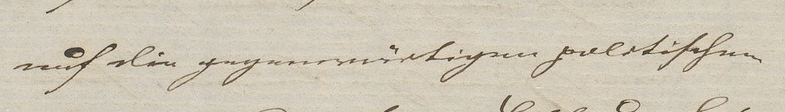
auf die gegenwärtigen politischen
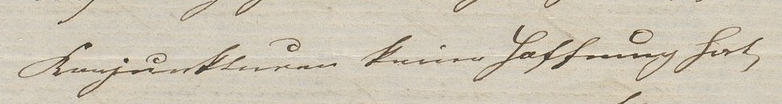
Konjunkturen keine Hoffnung hat,
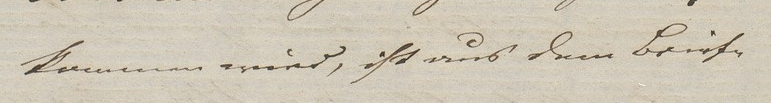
kommen wird, ist aus dem Briefe
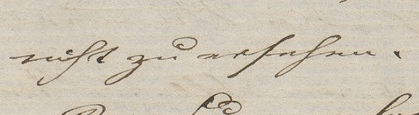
nicht zu ersehen.
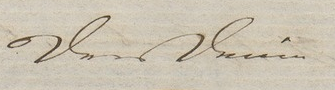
Der Deine
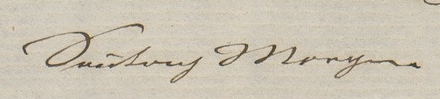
Sonntag Morgen.
